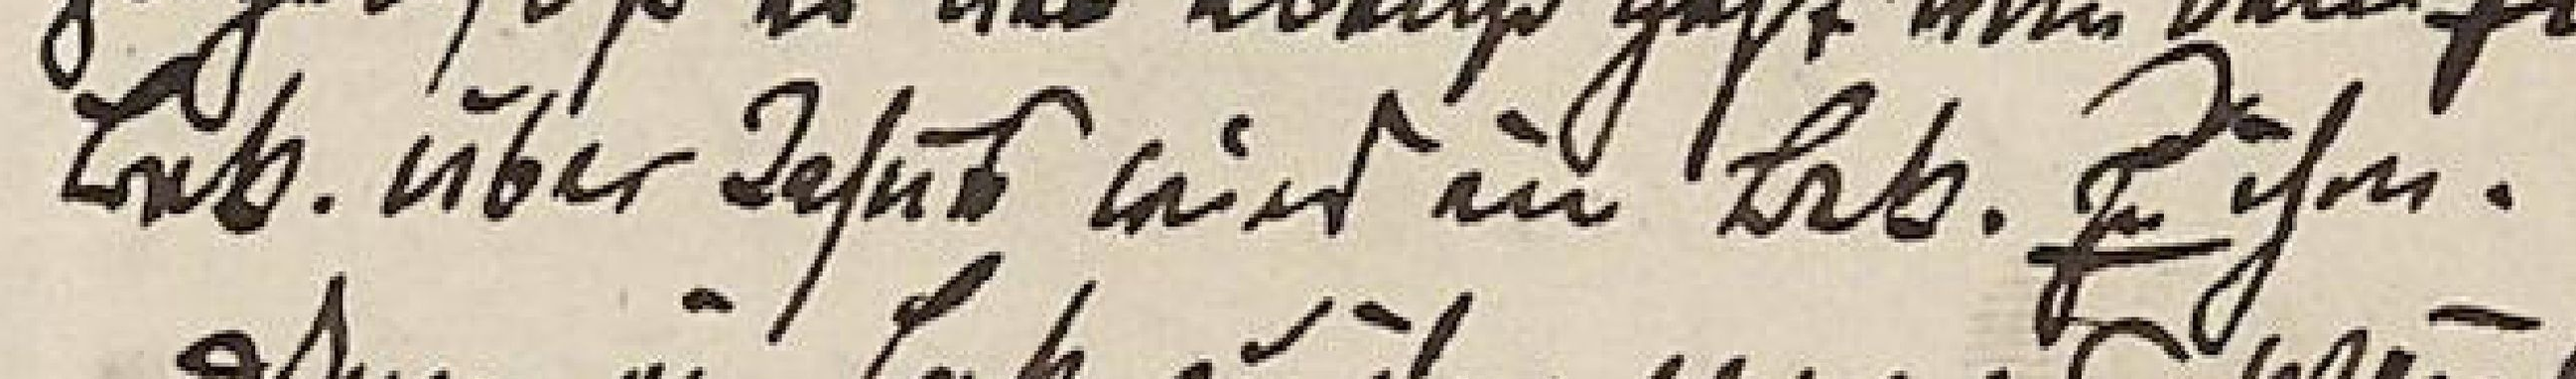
Bek. über Jesus wird ein Bek zu ihm.
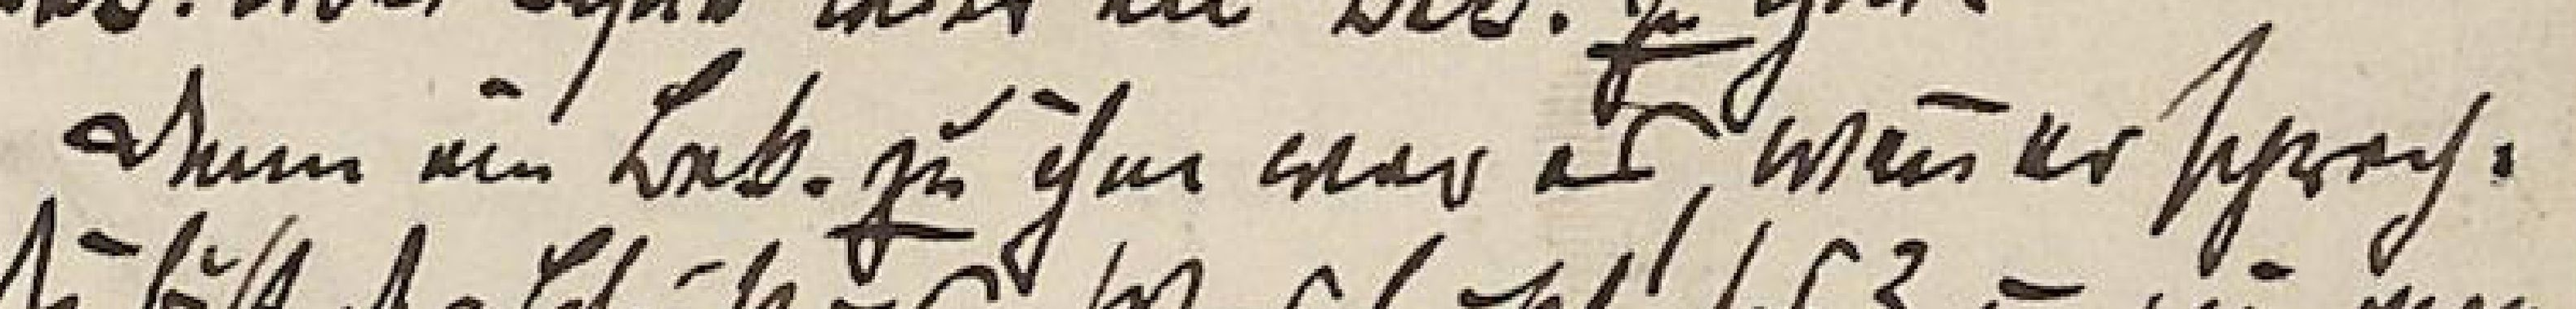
Denn ein Bek. zu ihm war es, wen er spracht:
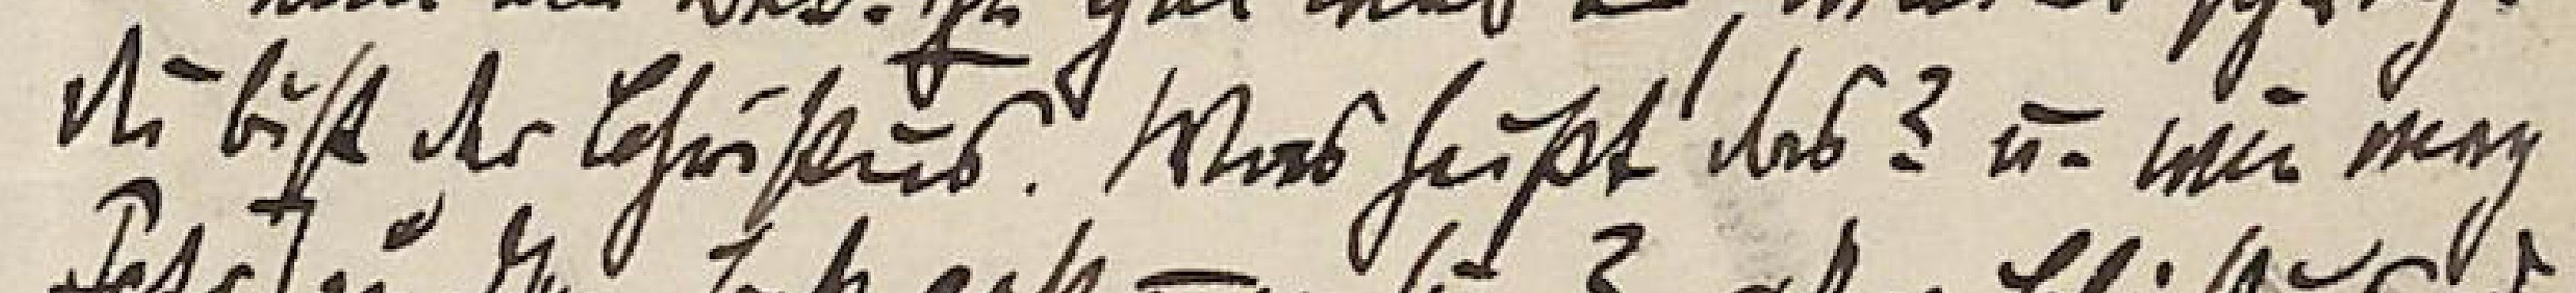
Du bist der Christus. Was heißt das? u. wie mag
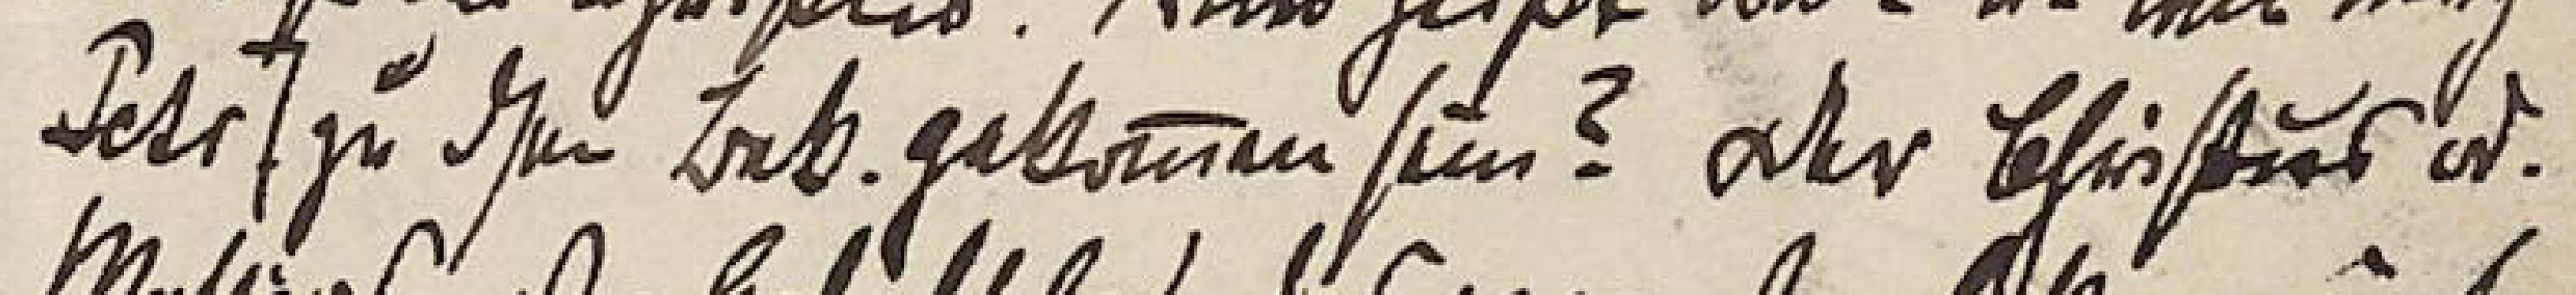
Petr. ] zu dsm Bek. gekomen sein? Der Christus od.
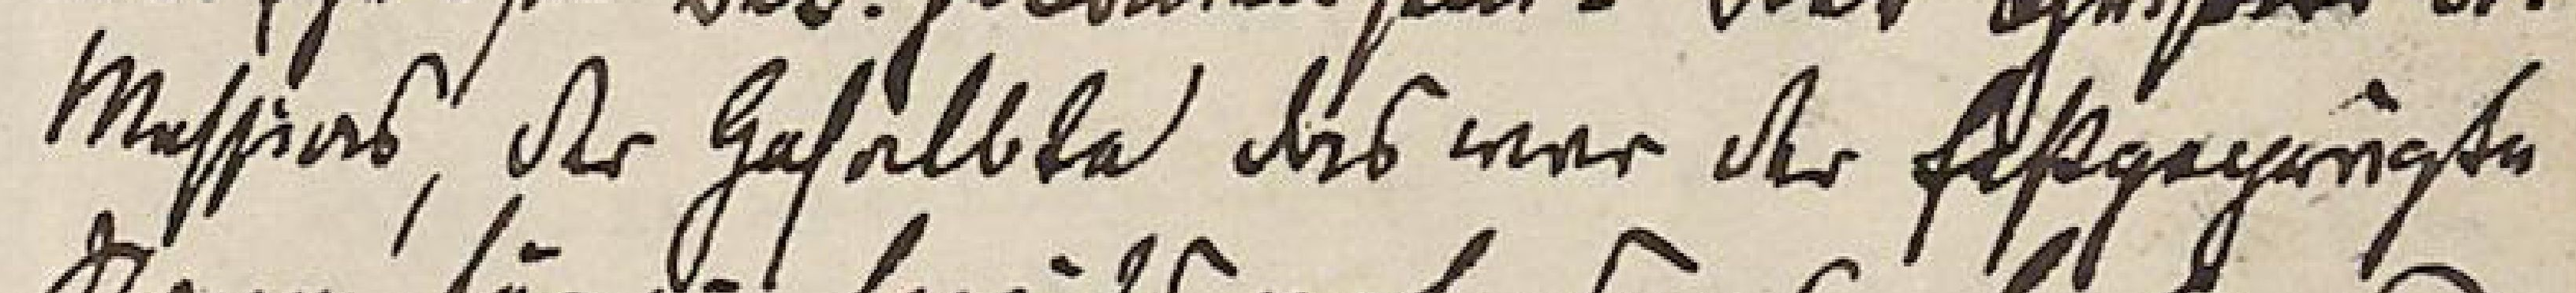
Messias, der Gesalbte das war der festgeprägte
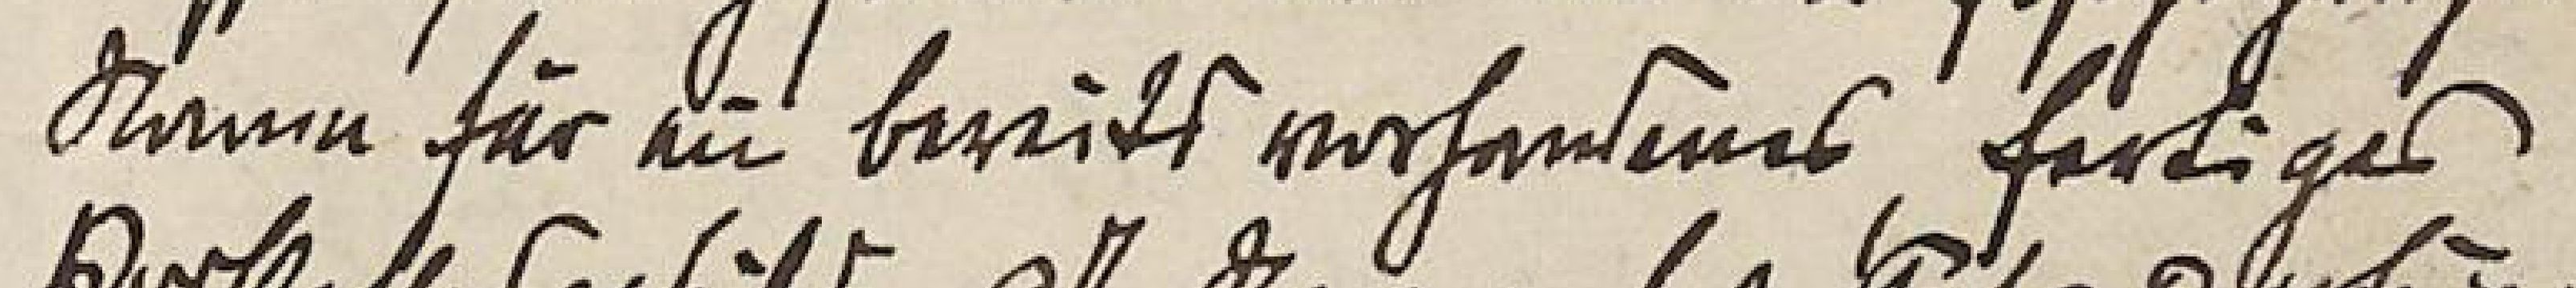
Name für ein bereits vorhandenes, fertiges
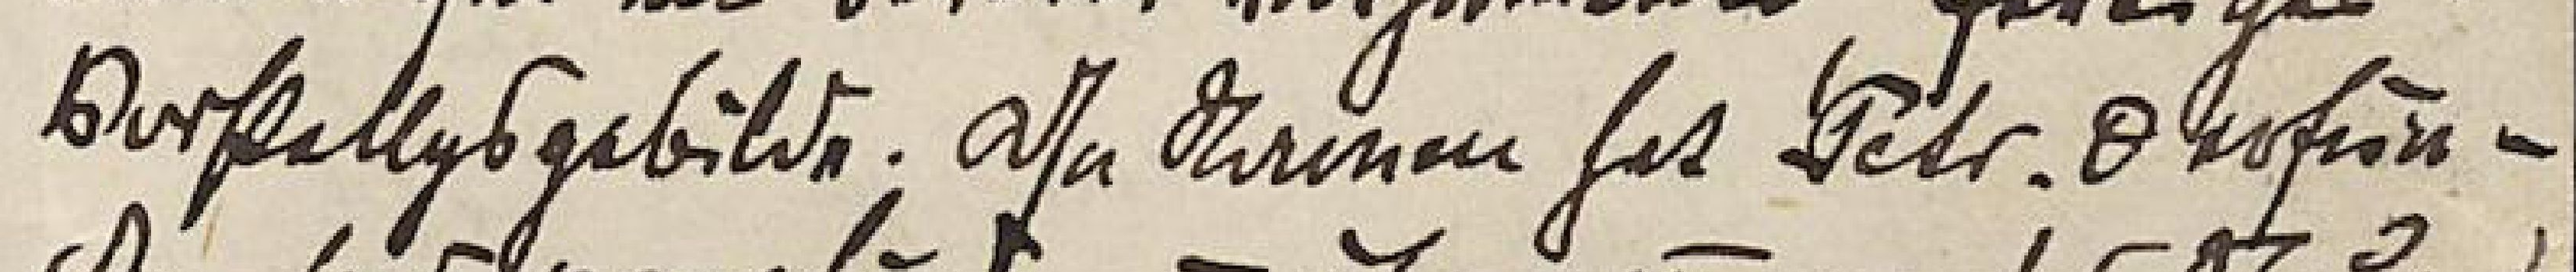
Vorstellgsgebilde. Dsn Namen hat Petr. o erfun¬
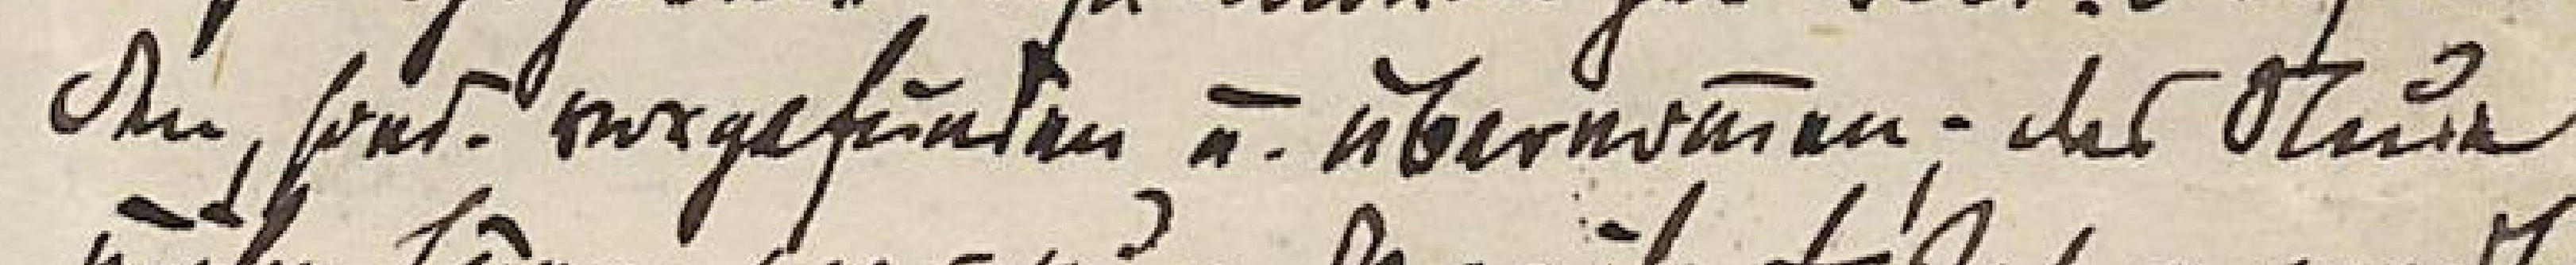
den, sond. vorgefunden u. übernomen; das Neue
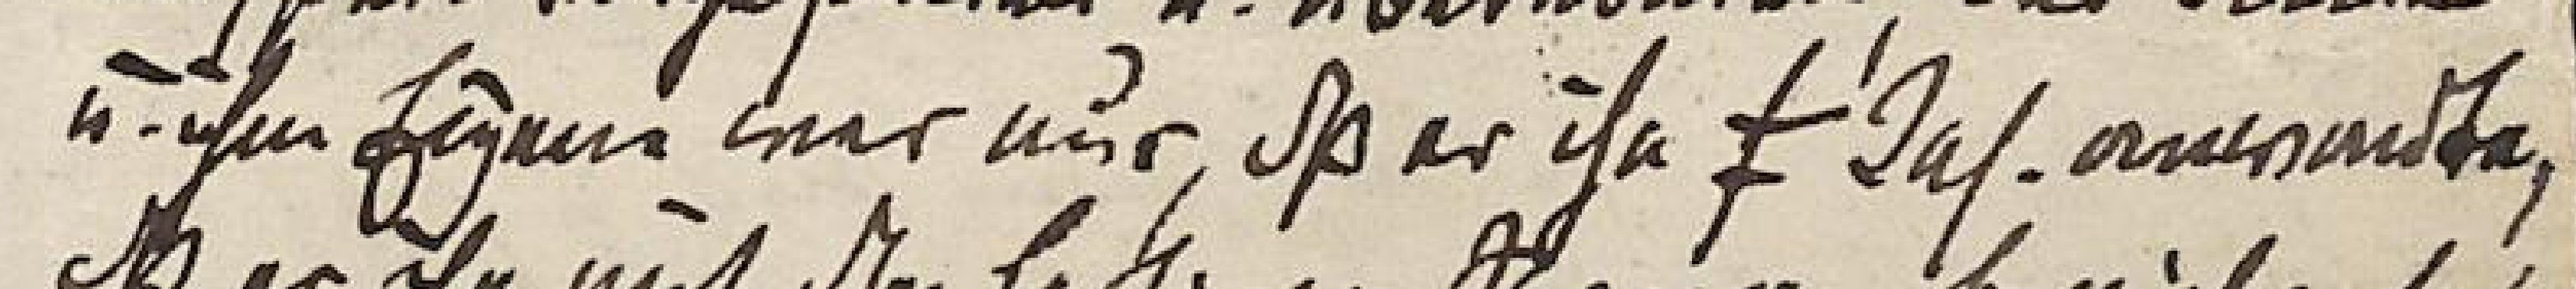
u. ihm Eigene war nur, daß er ihn f Jes. anwandte,
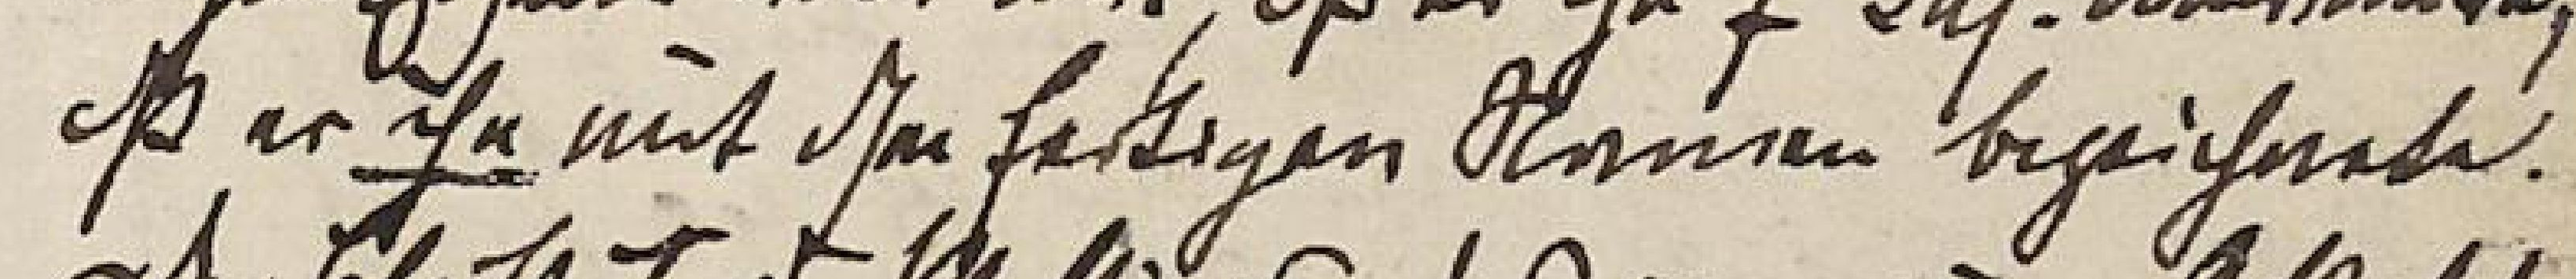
daß er ihn mit dsm fertigen Namen bezichnete.
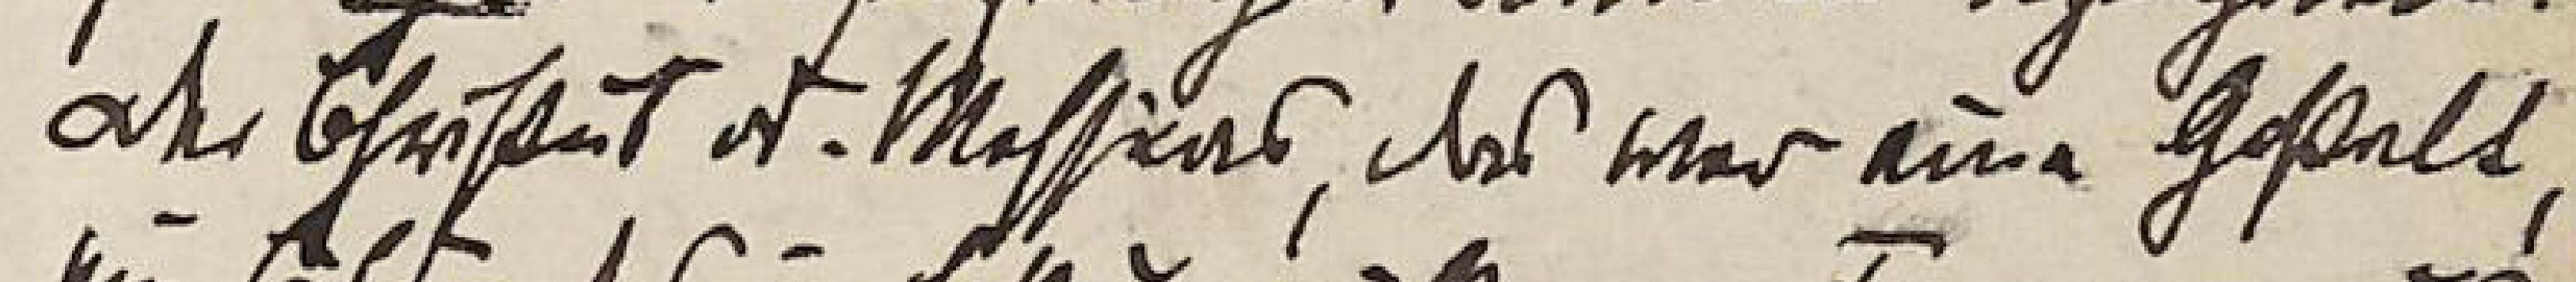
Der Christus od. Messias, das war eine Gestalt,
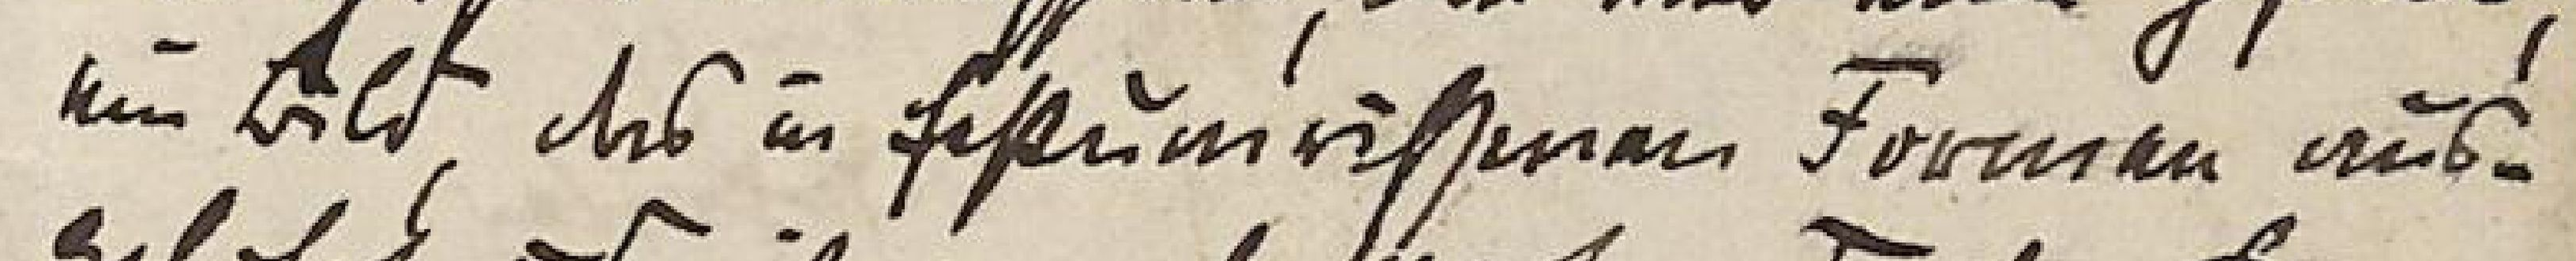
ein Bild, das in festumrissenen Formen aus¬
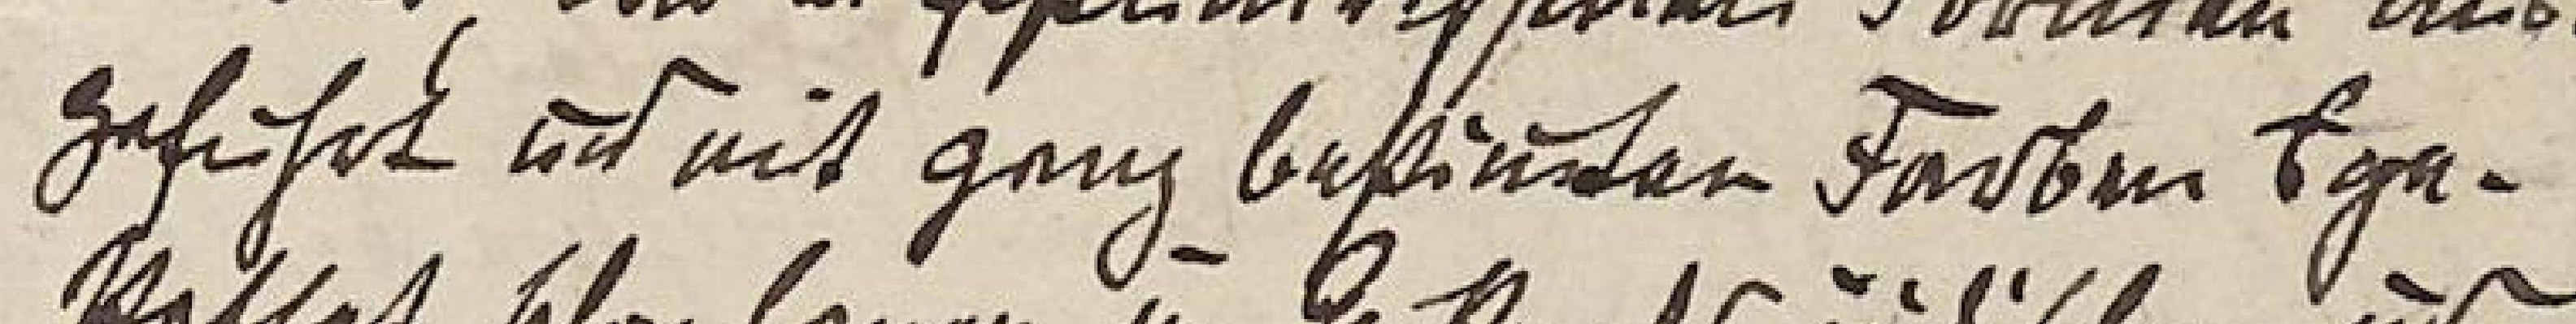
geführt und mit ganz bestimten Farben sge¬
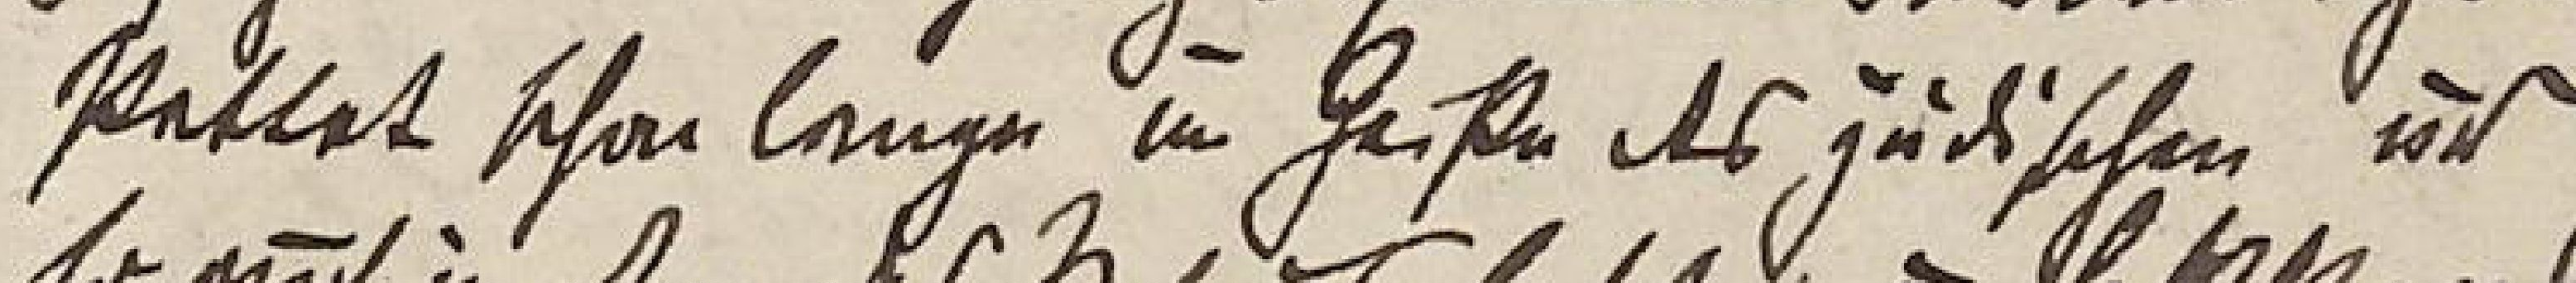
stattet schon lange im Geiste des jüdischen und
